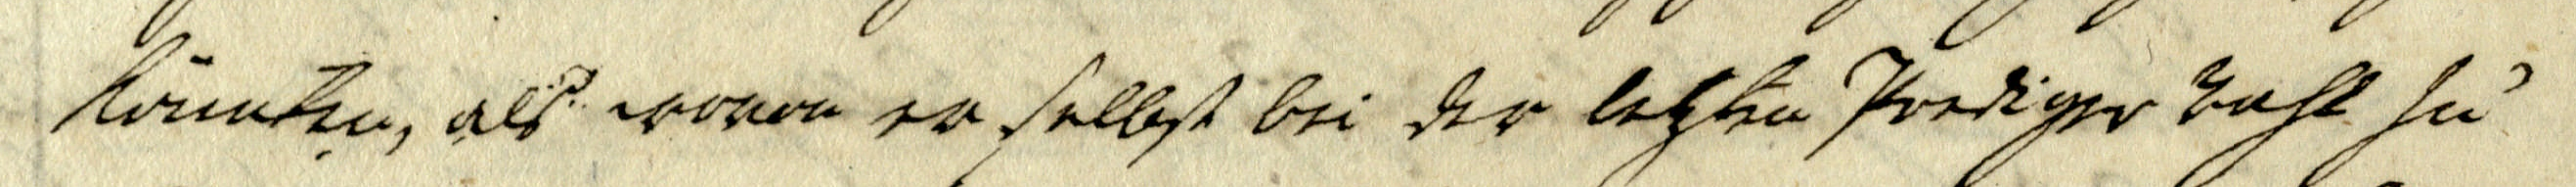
könnten, als wovon er selbst bei der letzten Prediger Wahl zu
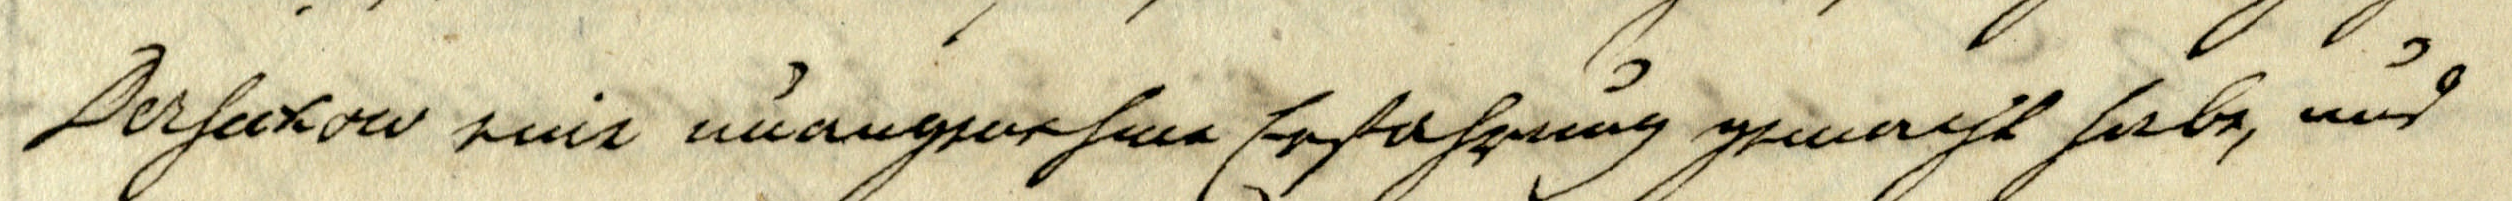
Dersekow eine unangenehme Erfahrung gemacht habe, und
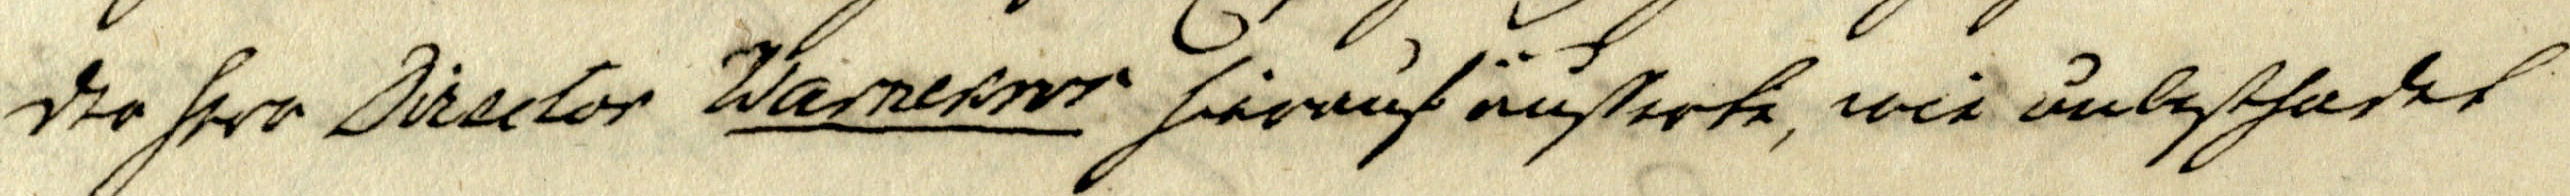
der herr Director Warnekros hierauf äusserte, wie unbeschadet
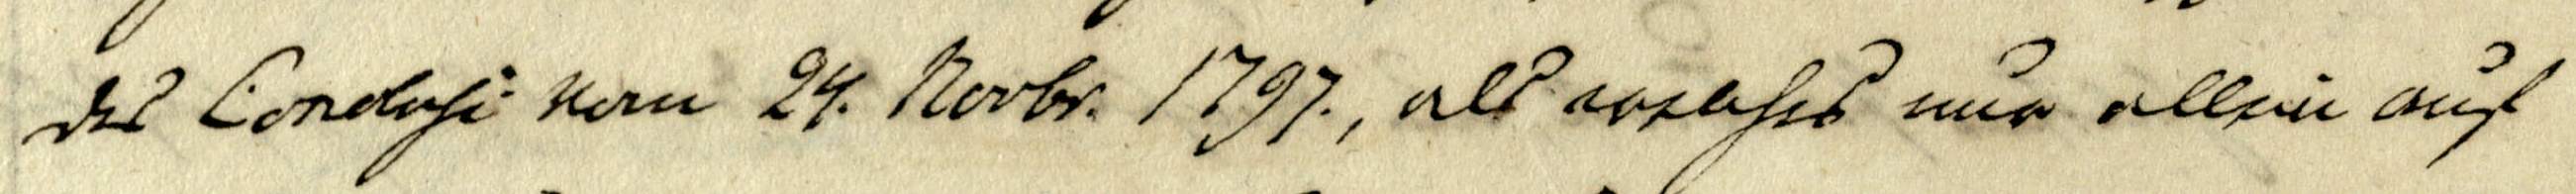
das Conclusi vom 24. Novbr. 1797, als welches nur allein auf
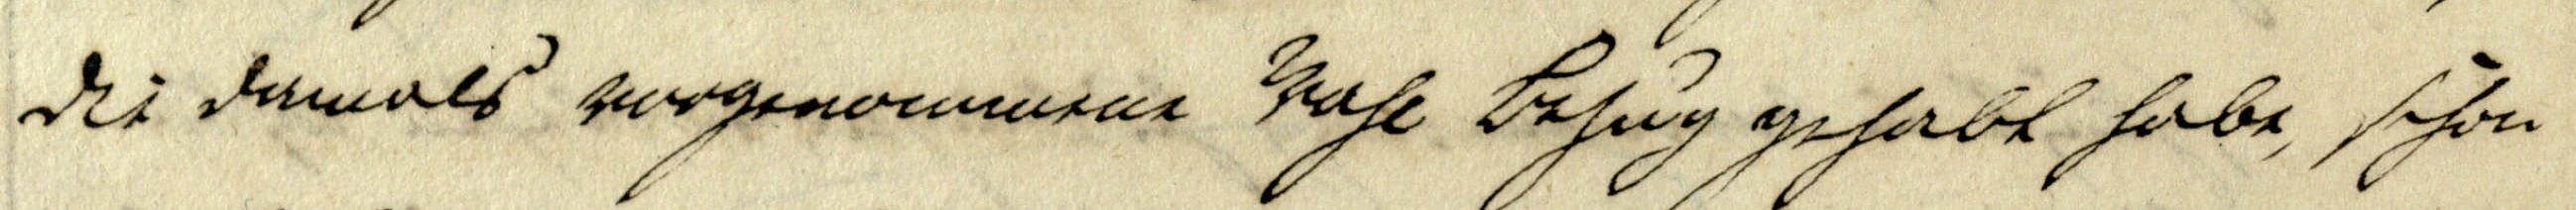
die damals vorgenommene Wahl Bezug gehabt habe, schon
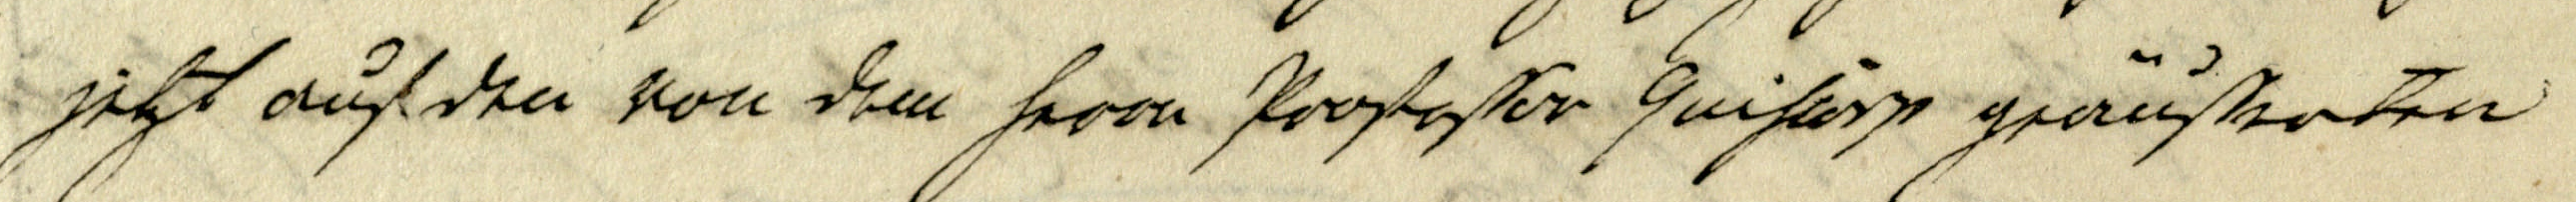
jetzt auf den von dem herrn Professor Quistorp geäusserten
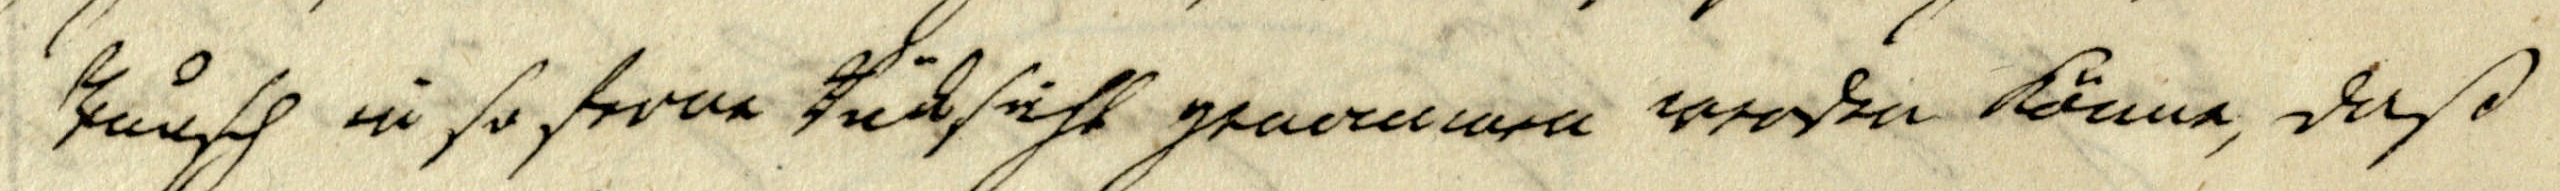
Wunsch in so fern Rücksicht genommen werden könne, daß
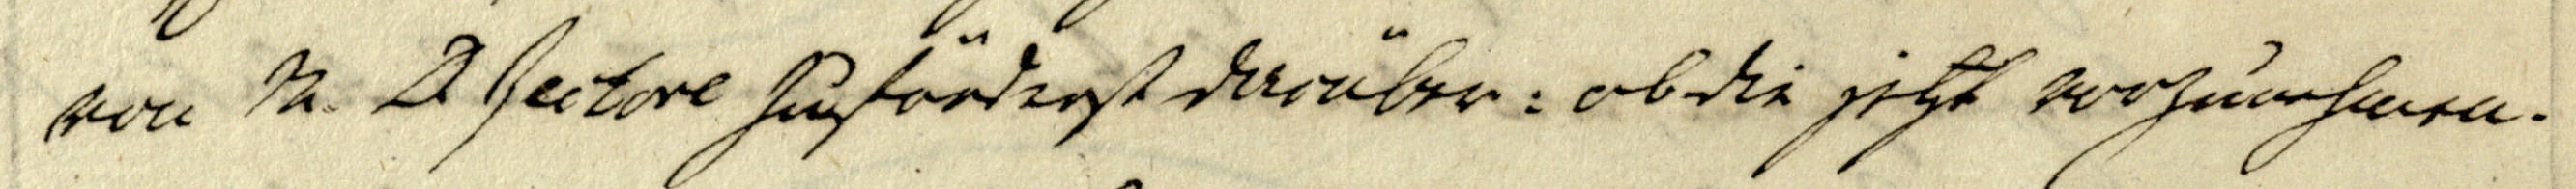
von M. D. Rectore zuförderst darüber: ob die jetzt vorzunehmen¬
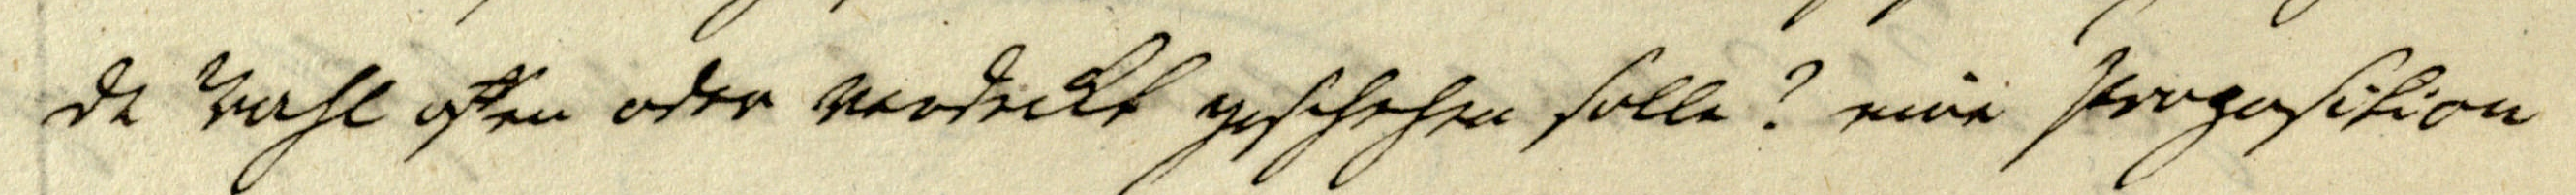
de Wahl offen oder verdeckt geschehen solle? eine Proposition
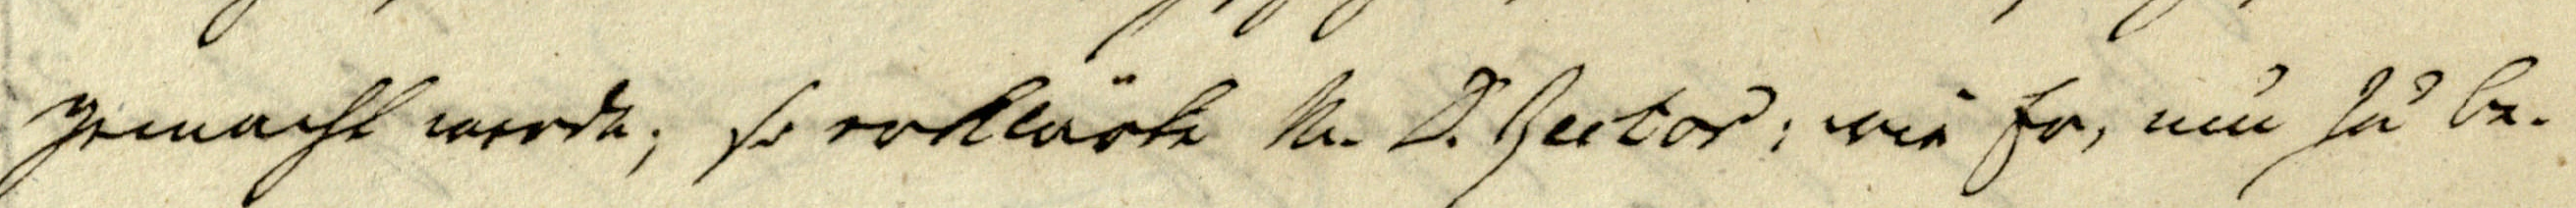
gemacht werde; so erklärte M. D. Rector: wie Er, um zu be¬
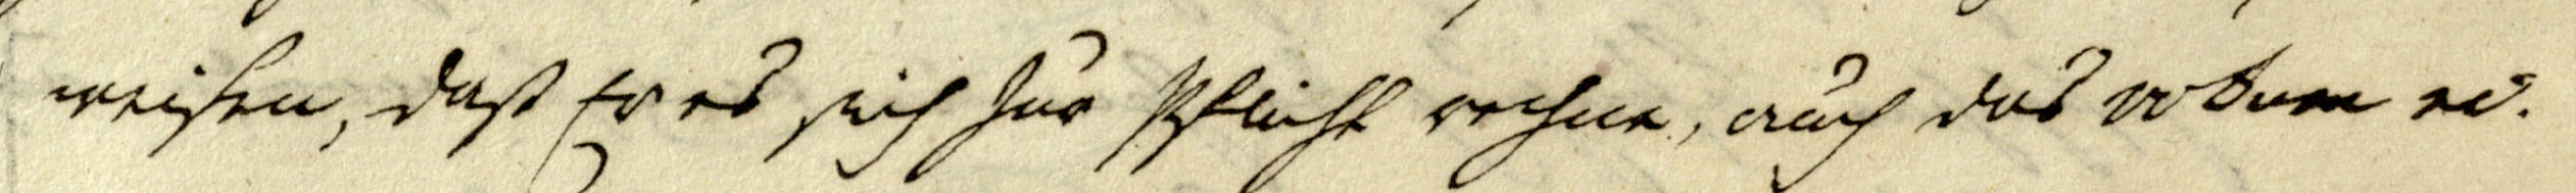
weisen, daß Er es sich zur Pflicht rechne, auch das votum ei¬
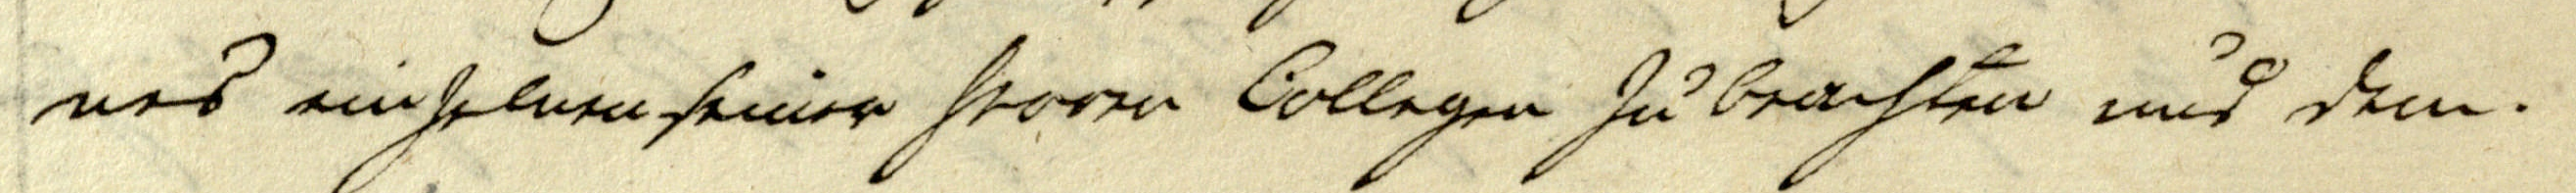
nes einzelnen seiner herren Collegen zu beachten und dem¬
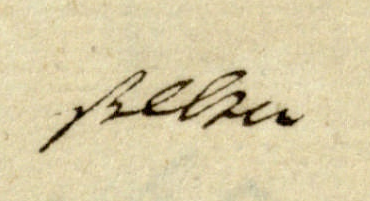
selben
